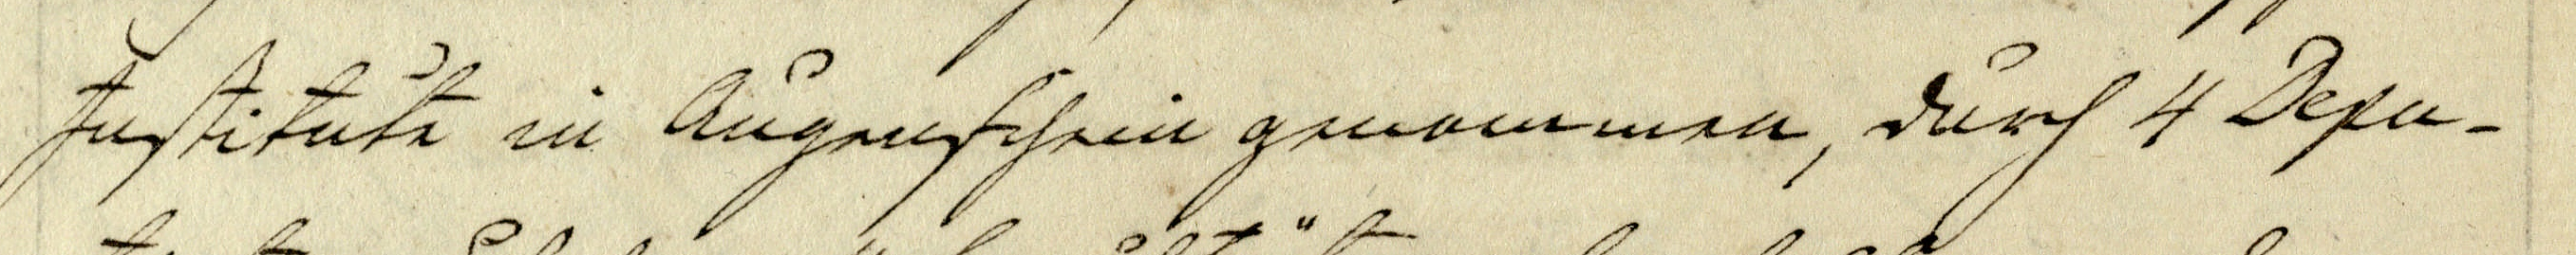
Institute in Augenschein genommen, durch 4 Depu¬
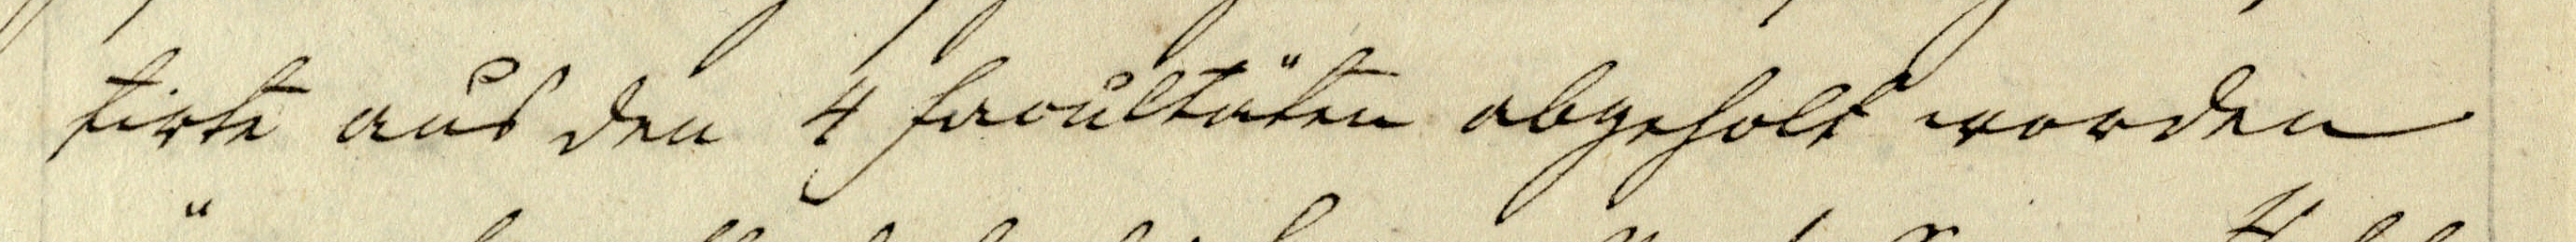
tirte aus den 4 Facultäten abgeholt worden
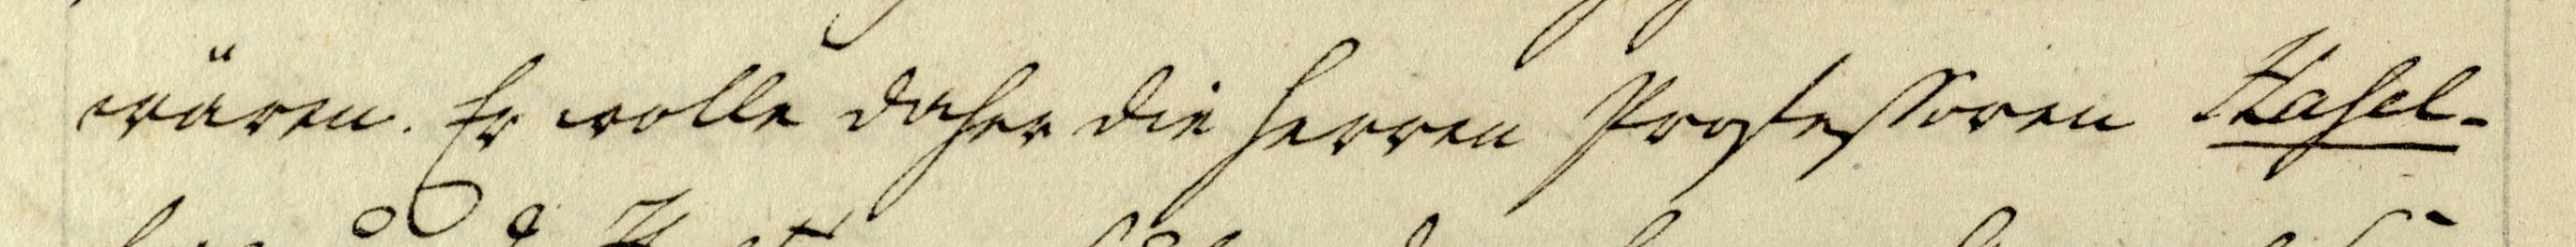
wären. Er wolle daher die Herren Professoren Hasel¬
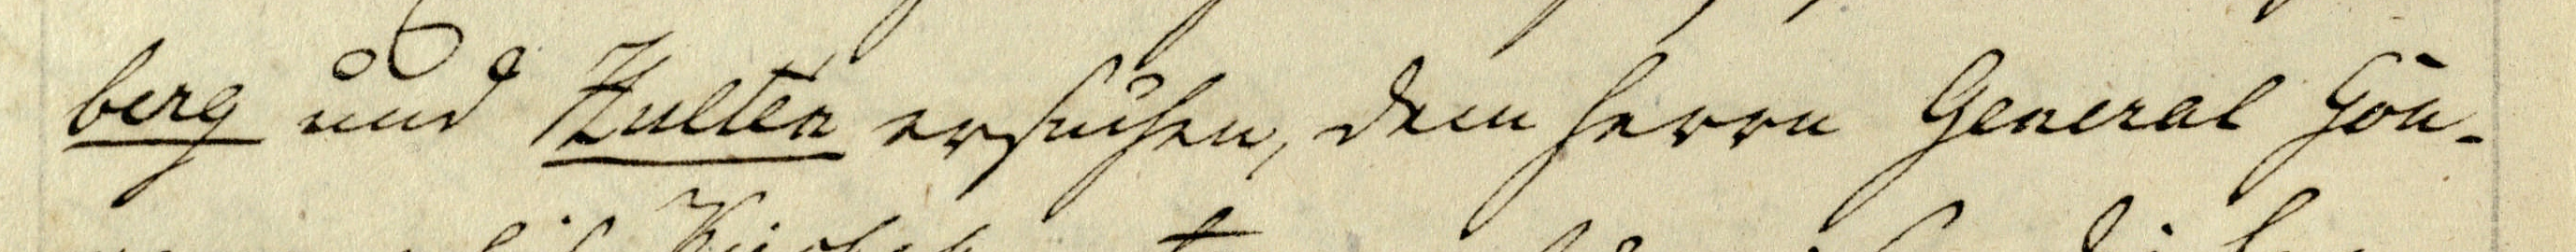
berg und Hultén ersuchen, dem Herrn General Gou¬
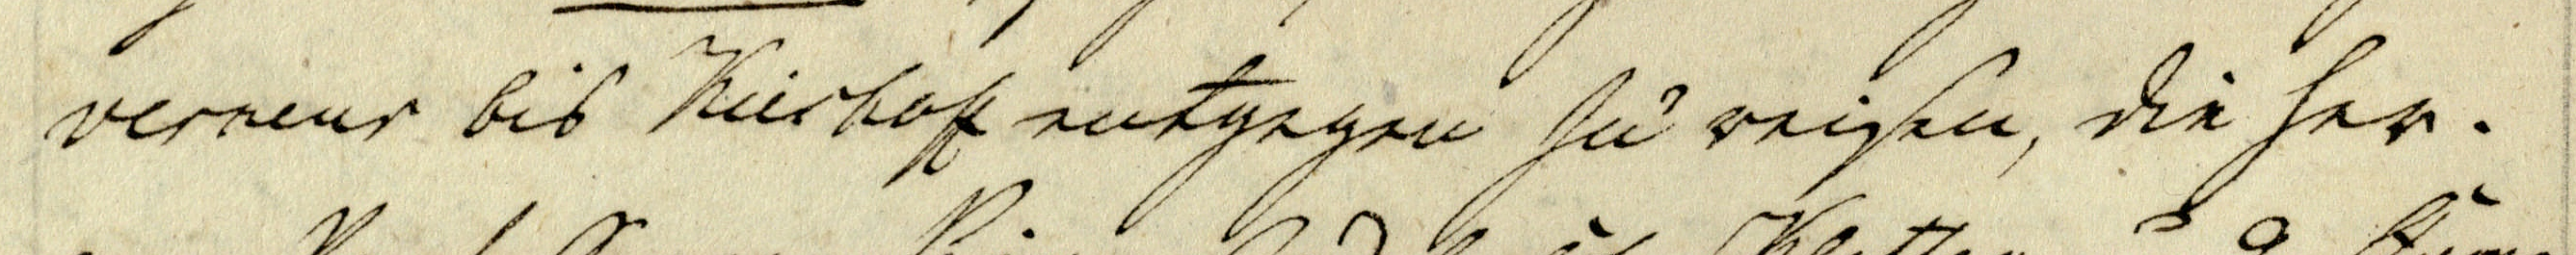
verneur bis Kieshoff entgegen zu reisen, die Her¬
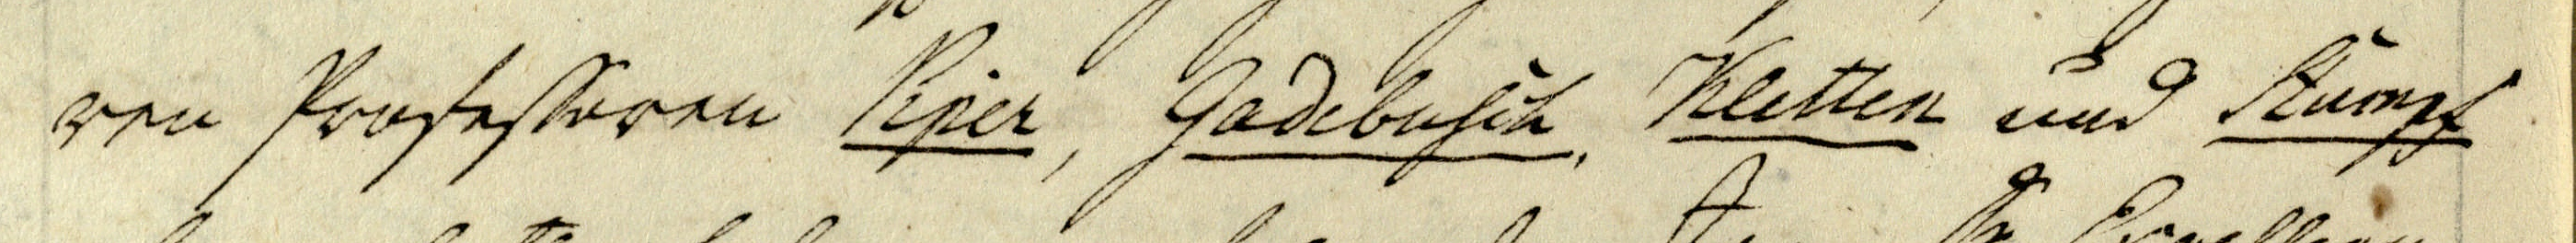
ren Professoren Piper, Gadebusch, Kletten und Stumpf
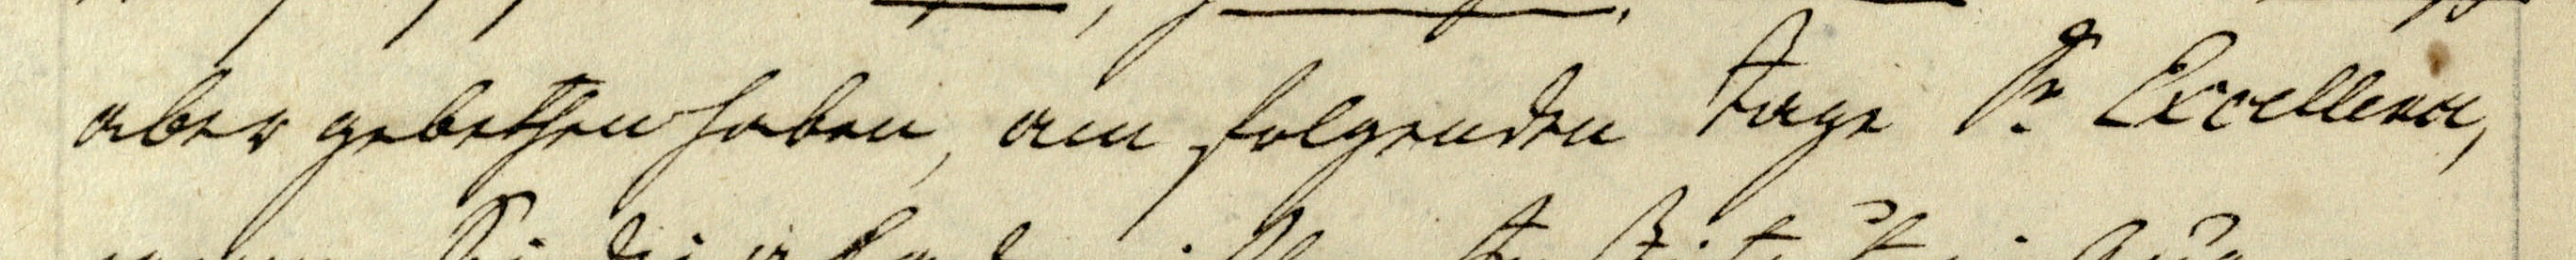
aber gebethenhaben, am folgenden Tage Sr Excellence,
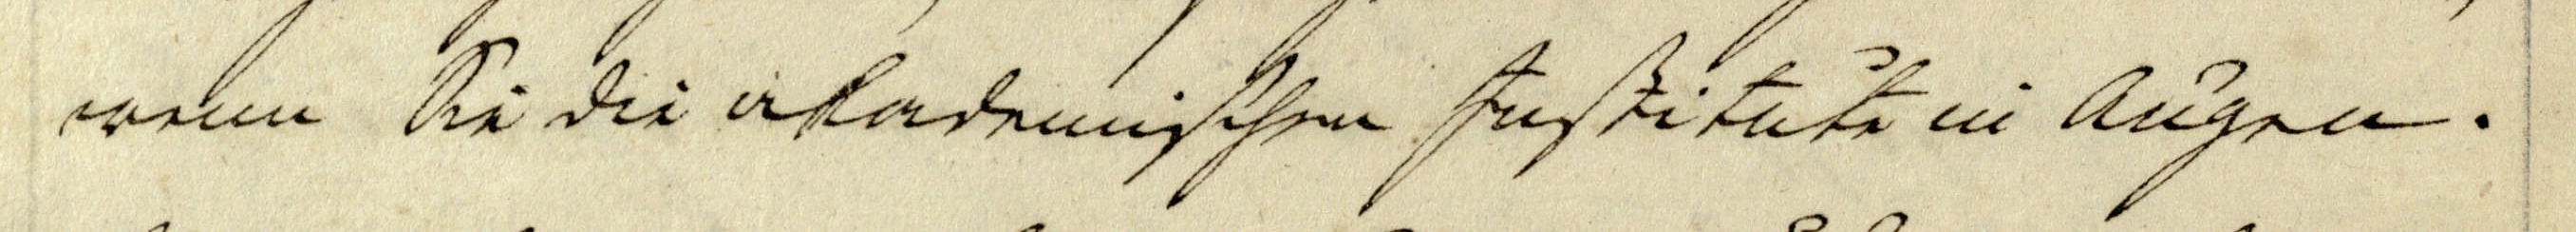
wenn Sie die akademischen Institute in Augen¬
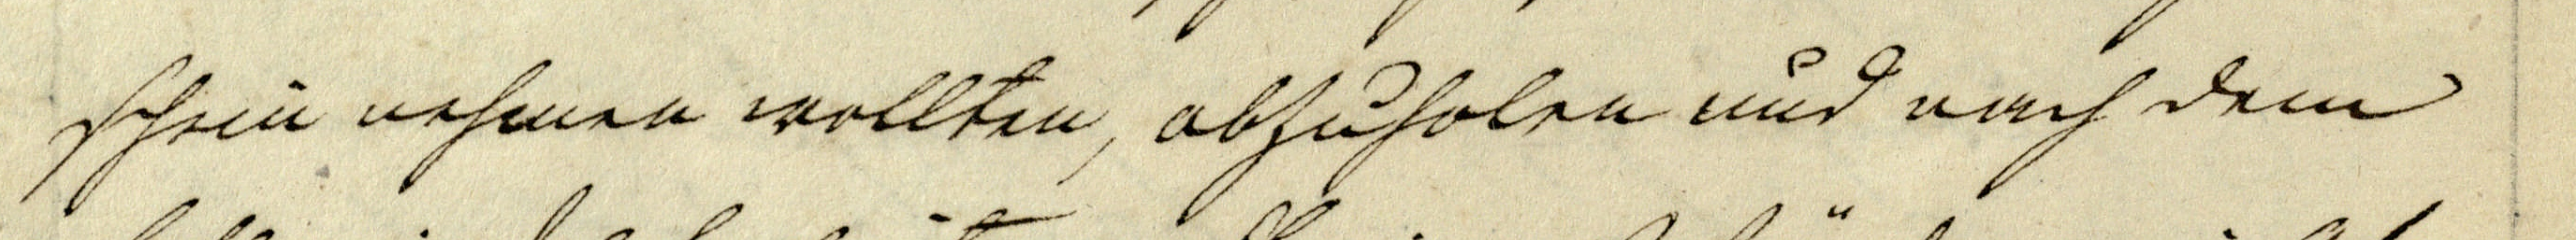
schein nehmen wollten, abzuholen und nach dem
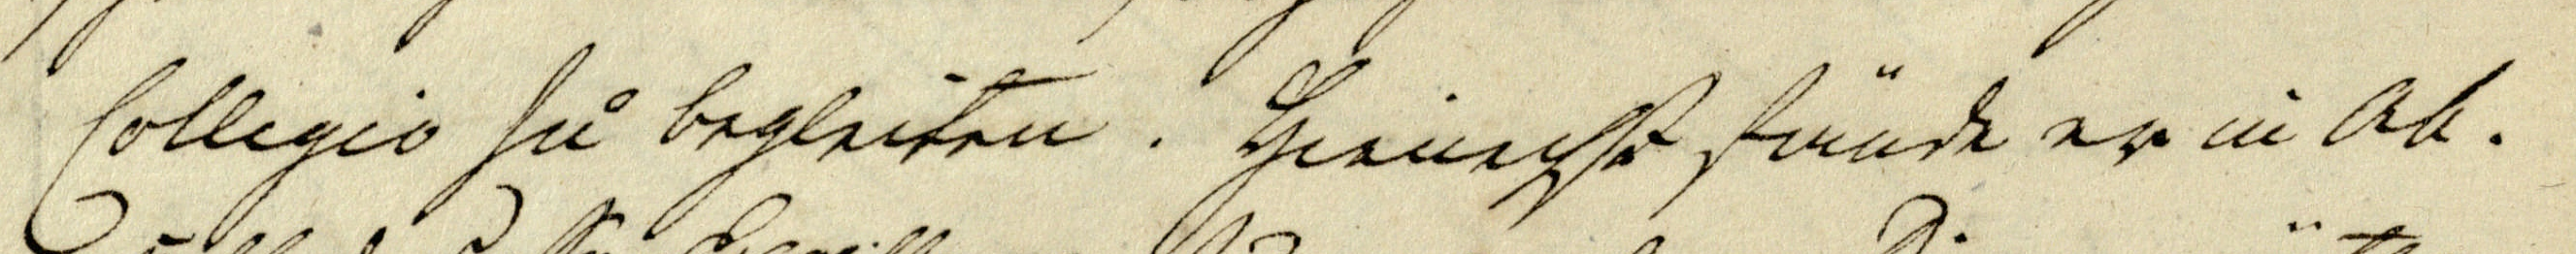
Collegio zu begleiten . Hienechst fände er in Ab¬
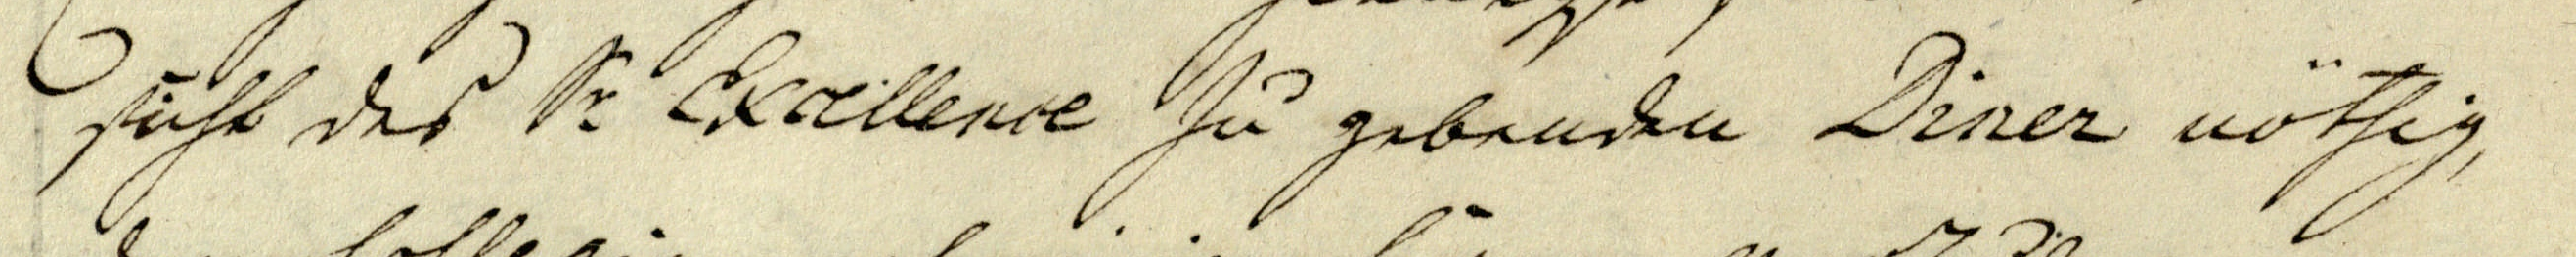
sicht des Sr Excellence zu gebenden Diner nöthig,
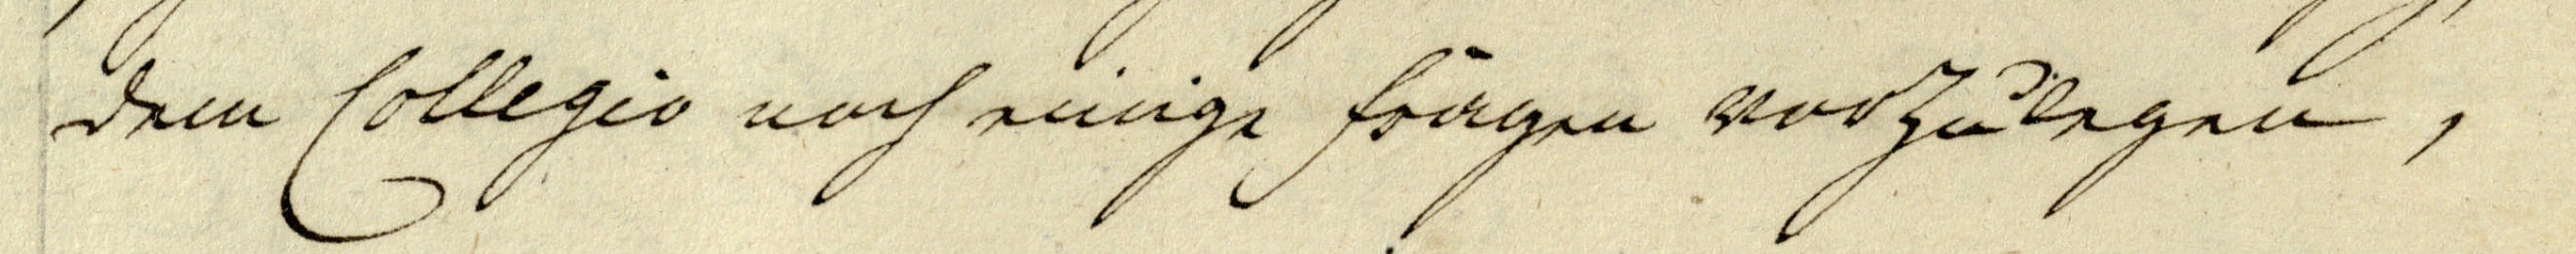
dem Collegio noch einige Fragen vorzulegen,
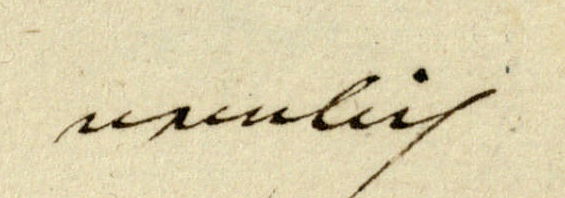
nemlich
